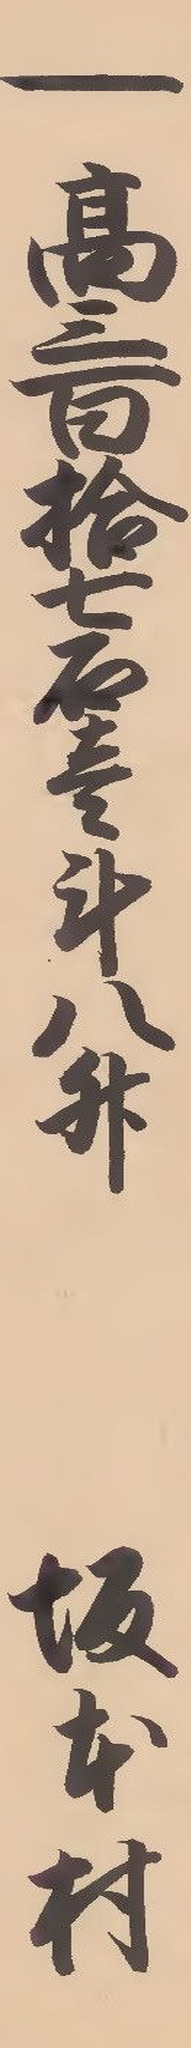一髙三百拾七石壱斗八升坂本村
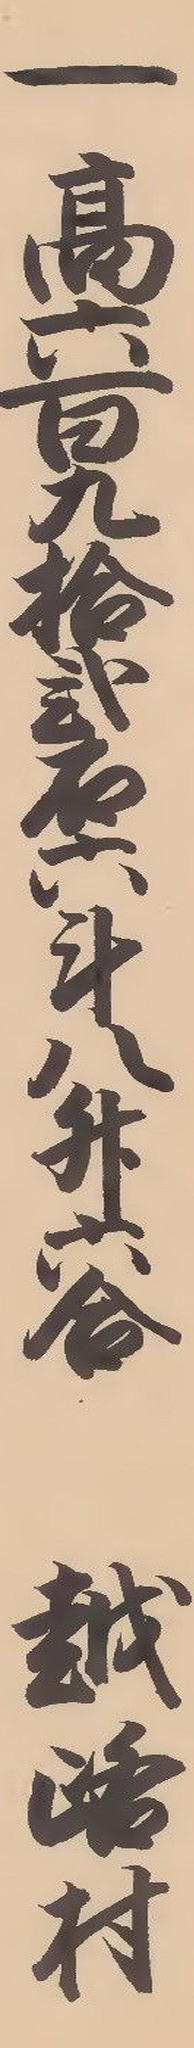一髙六百九壱弐石六斗八升六合越路村
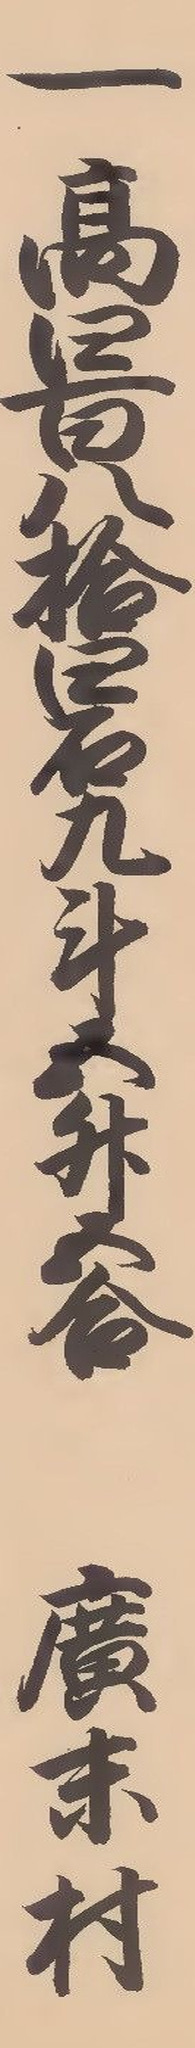一髙四百八拾四石九斗五升五合廣末村
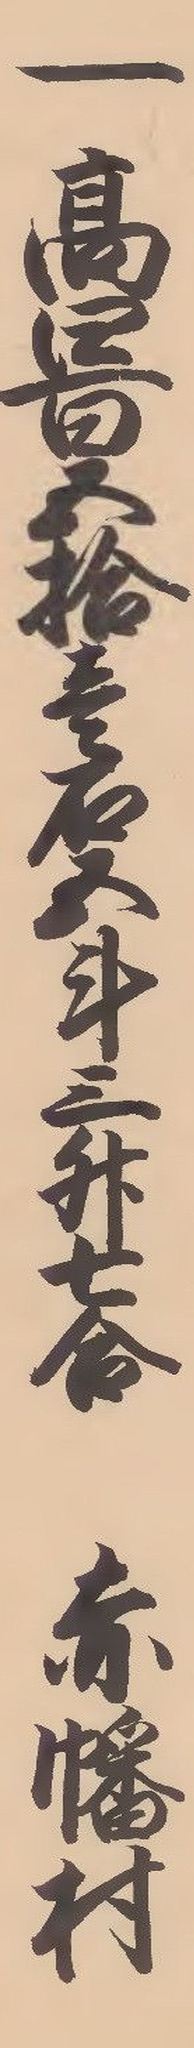一高四百五拾壱石五斗三升七合赤幡村

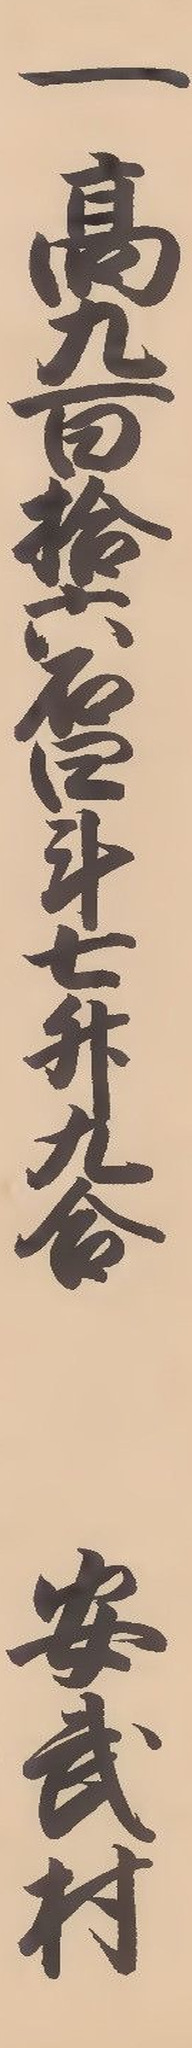一髙九百拾六石四斗七升九合安武村
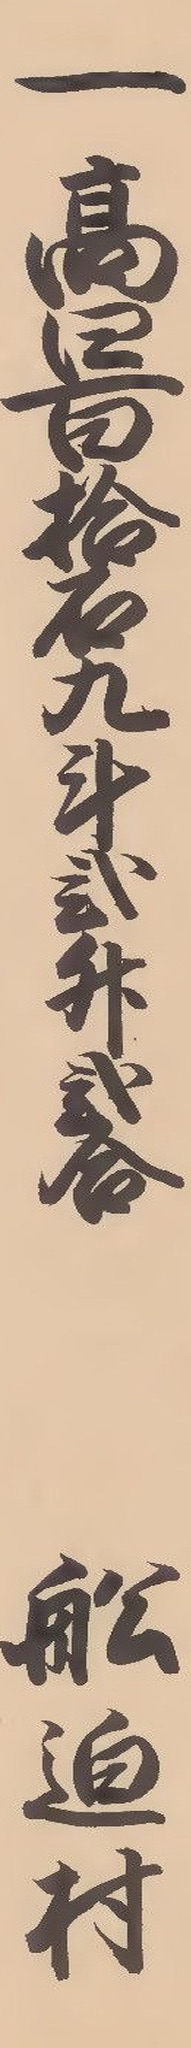一髙四百拾石九斗弐升弐合舩迫村
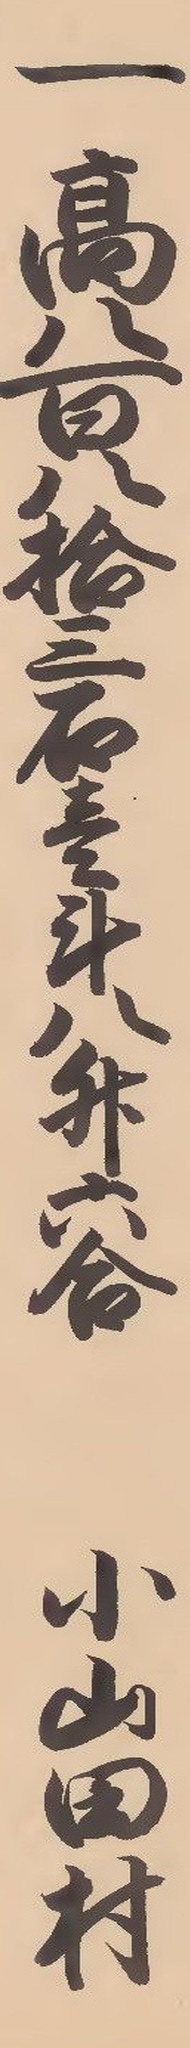一髙八百八拾三石壱斗八升六合小山田村
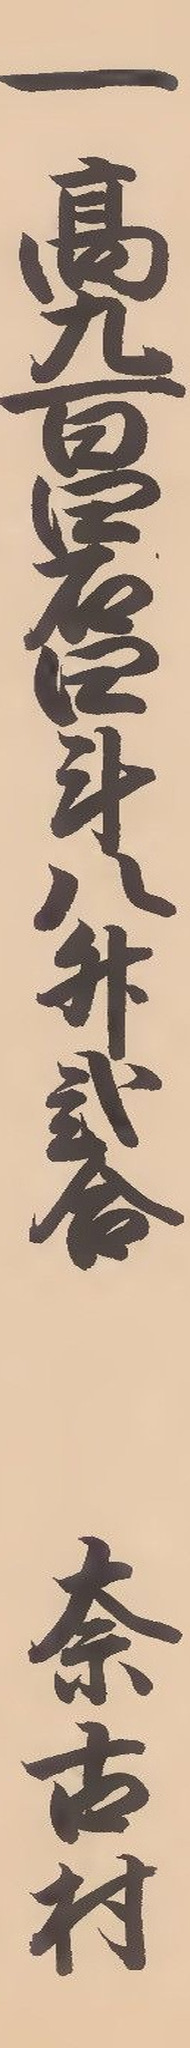一高九百四石四斗八升弐合奈古村
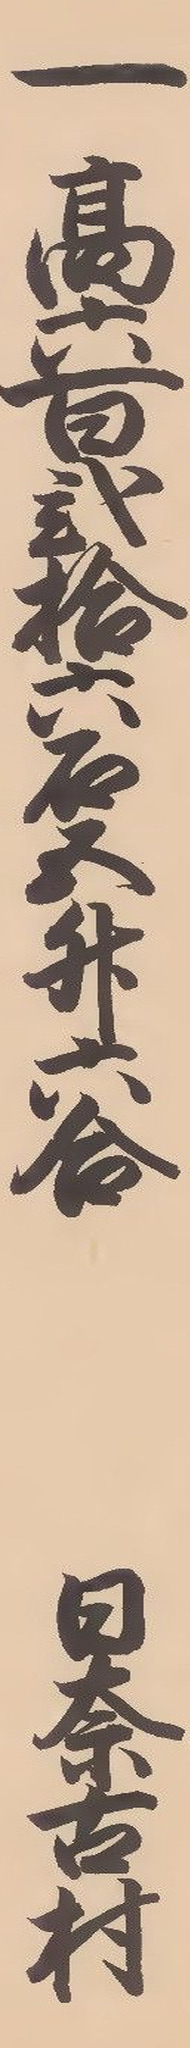一髙六百弐拾六石五升六合日奈古村
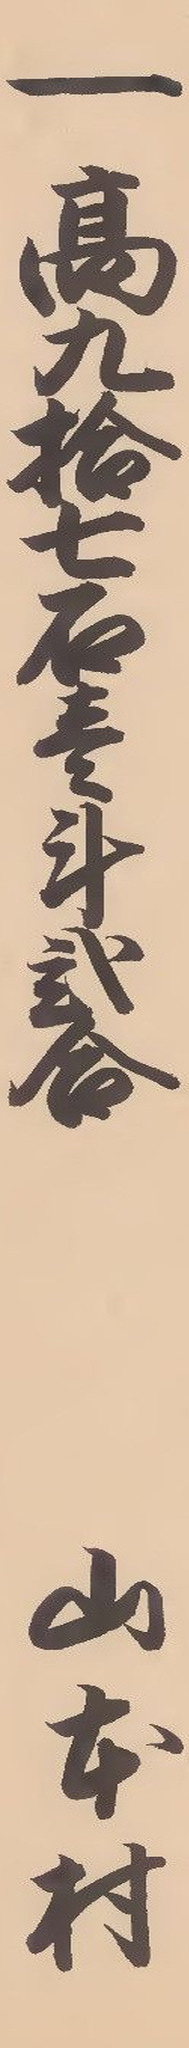一髙九拾七石壱斗弐合山本村
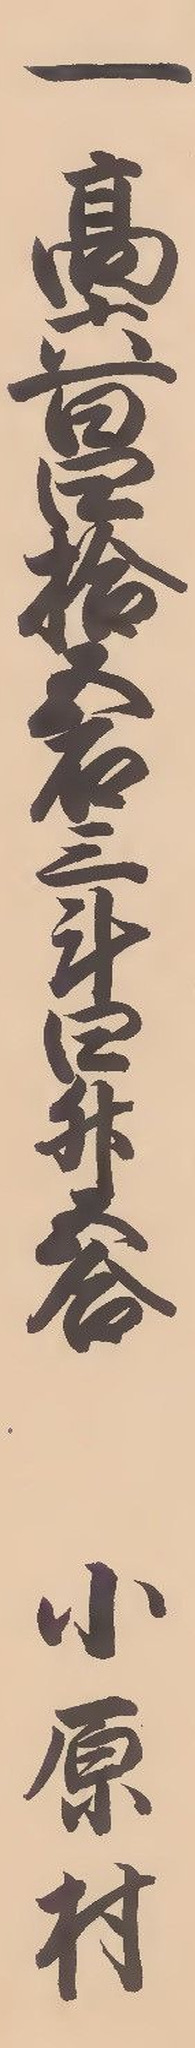一高六百四拾五石三斗四升五合小原村

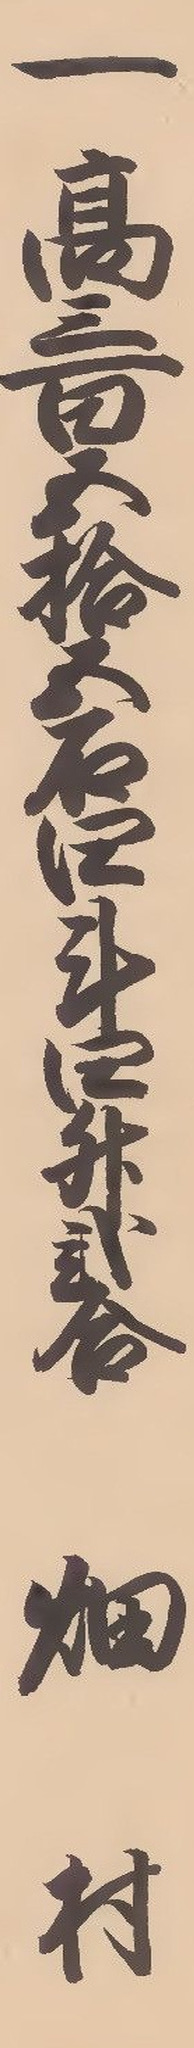一髙三百五拾五石四斗四升弐合畑村
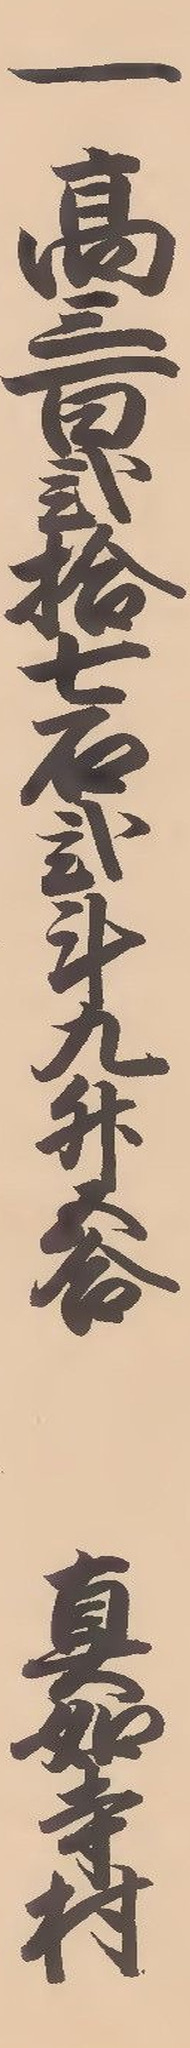一髙三百弐拾七石弐斗九升五合真如寺村
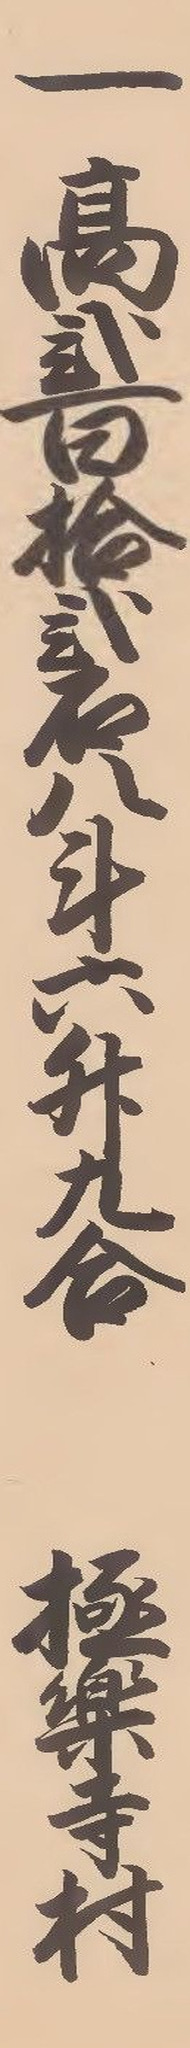一髙弐百拾弐石八斗六升九合極樂寺村
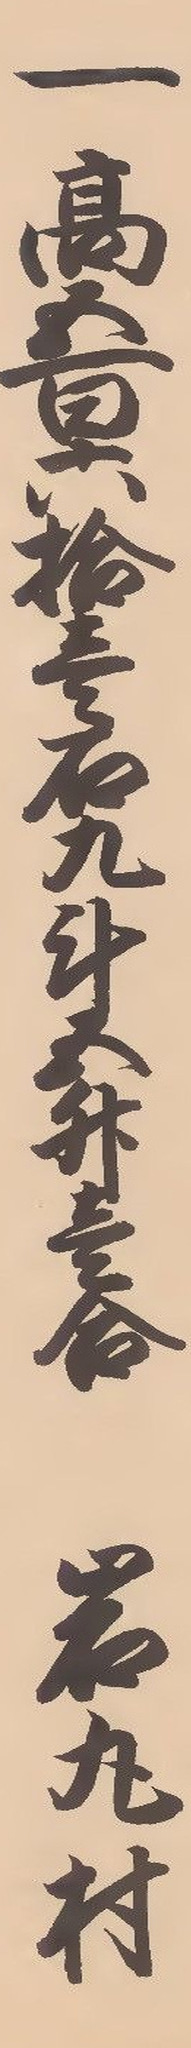一髙五百六拾壱石九斗五升壱合岩丸村
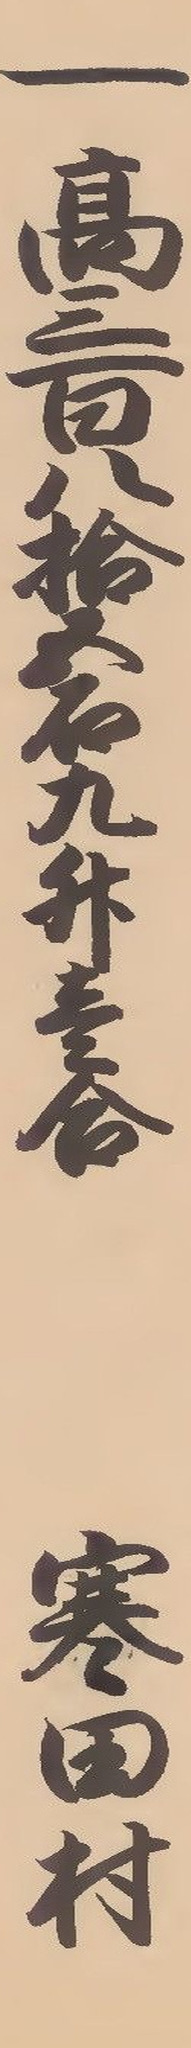一髙三百八拾五石九升壱合寒田村
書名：豊前国郷帳
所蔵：国立公文書館 National Archives of Japan
